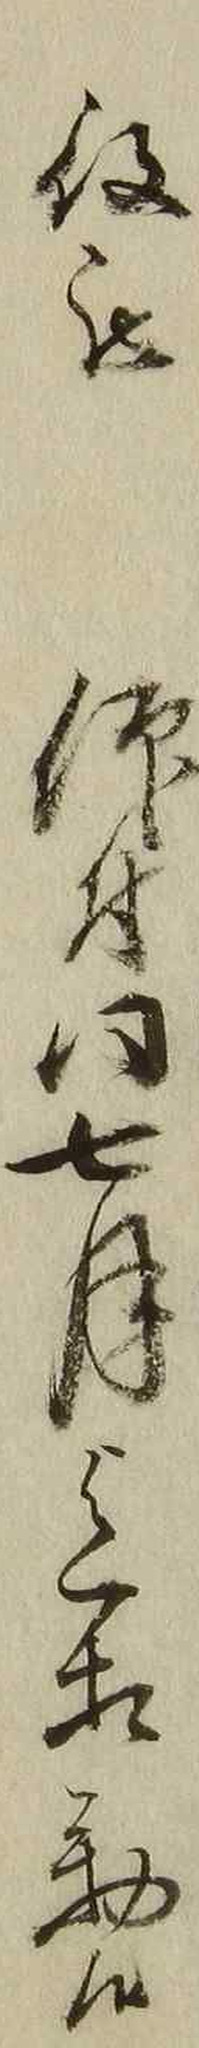役被仰付同七月迄所勤候
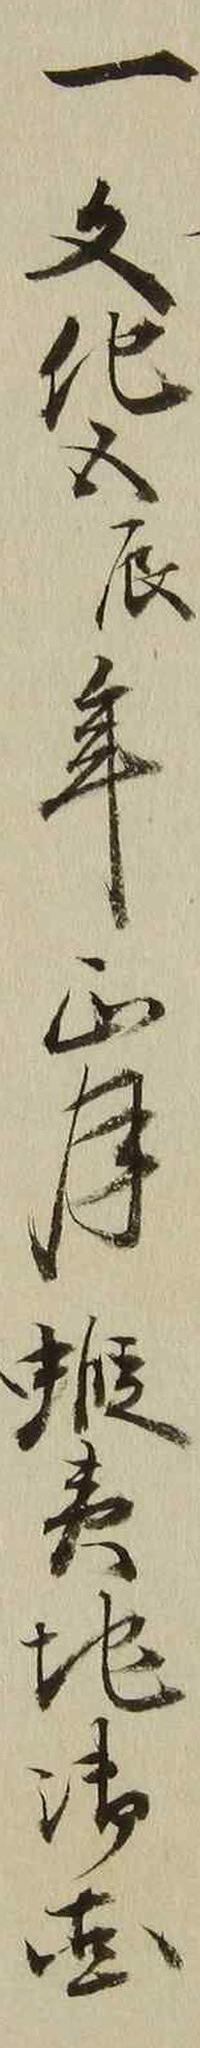一文化五辰年正月暇夷地御固
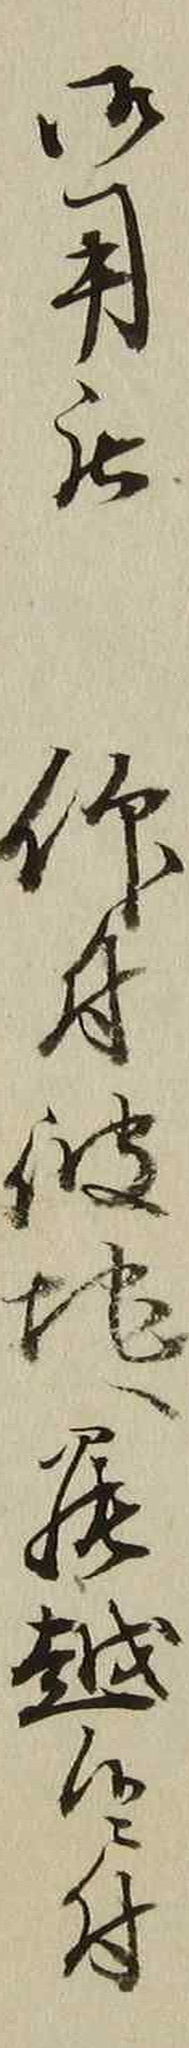御用被仰付彼地へ罷越候ニ付
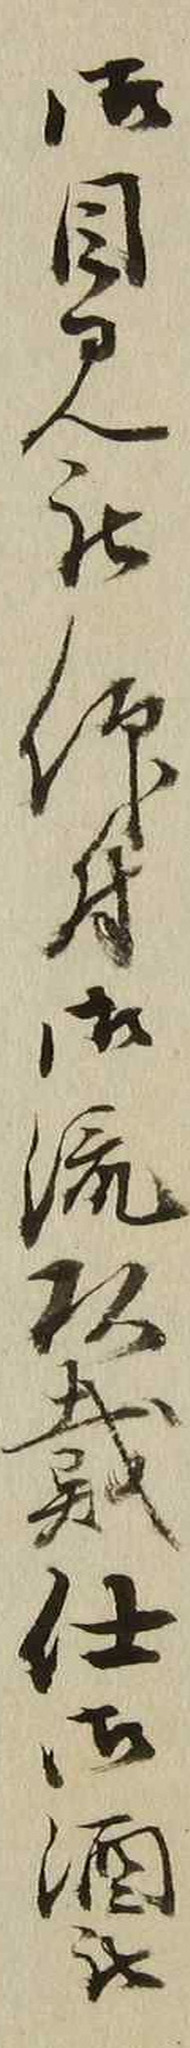御目見被仰付御流頂戴仕御酒被
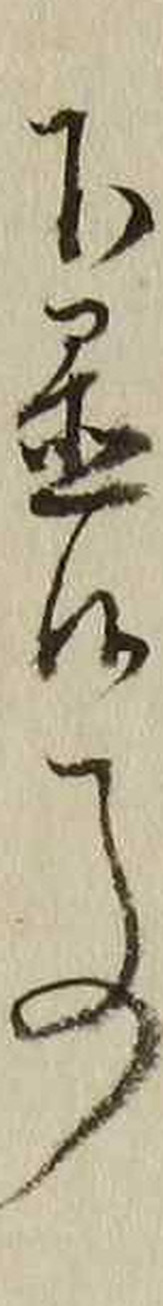下置候事
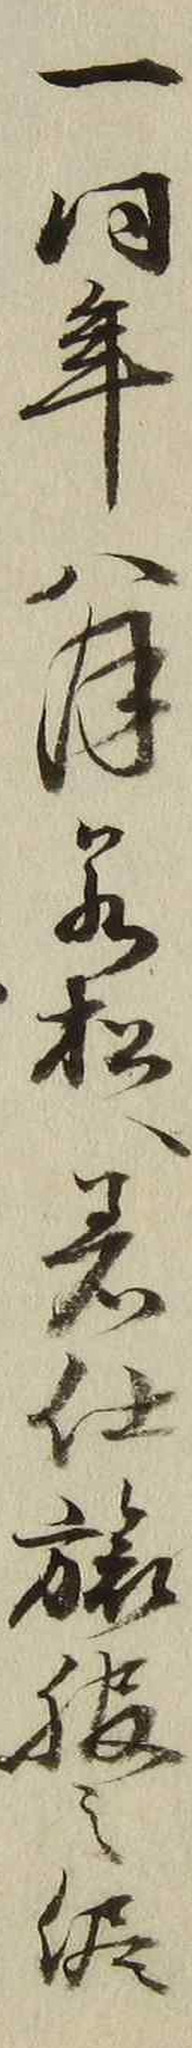一同年八月若松へ着仕旅服之儘
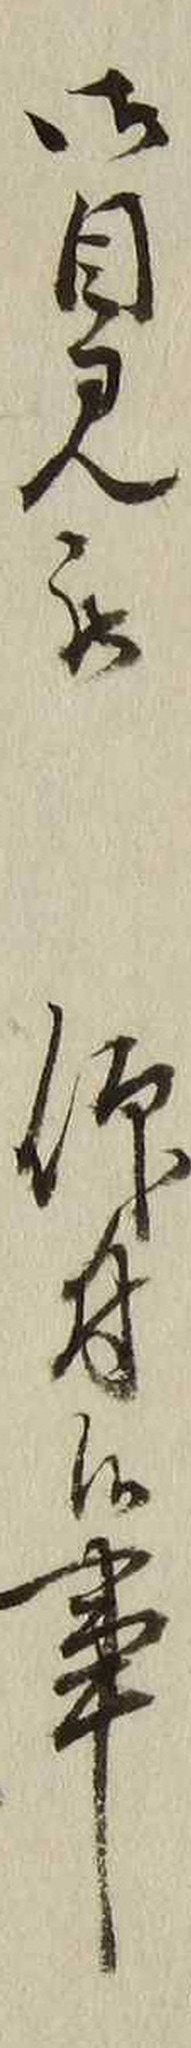御目見被仰付候事
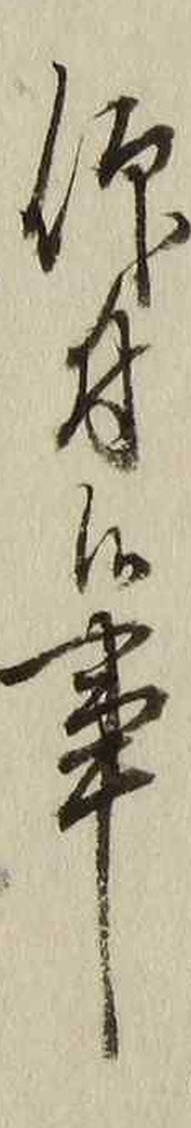仰付候事
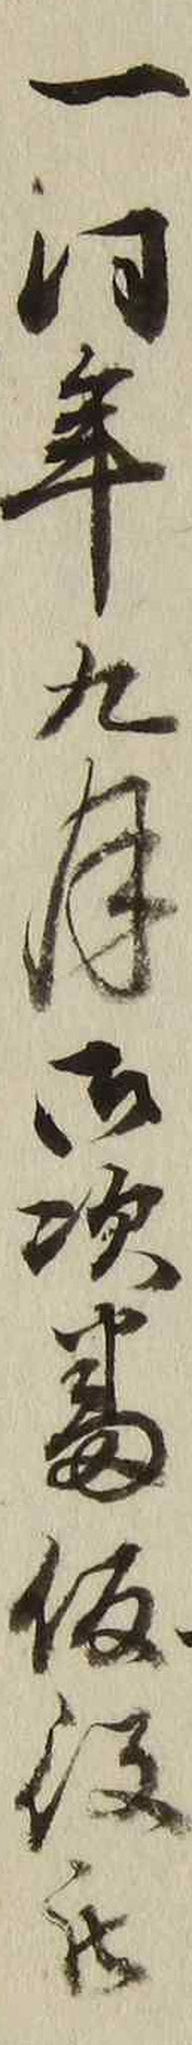一同年九月御次番仮役被
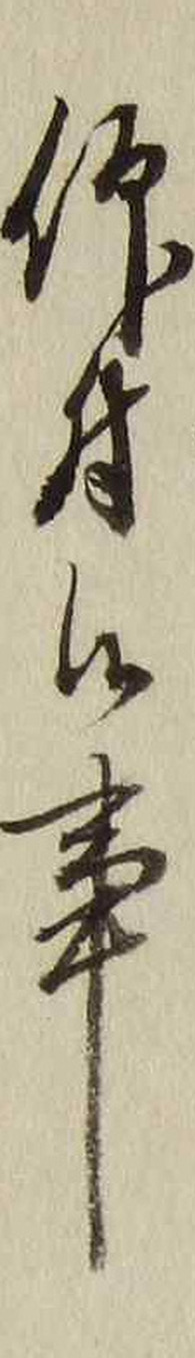仰付候事
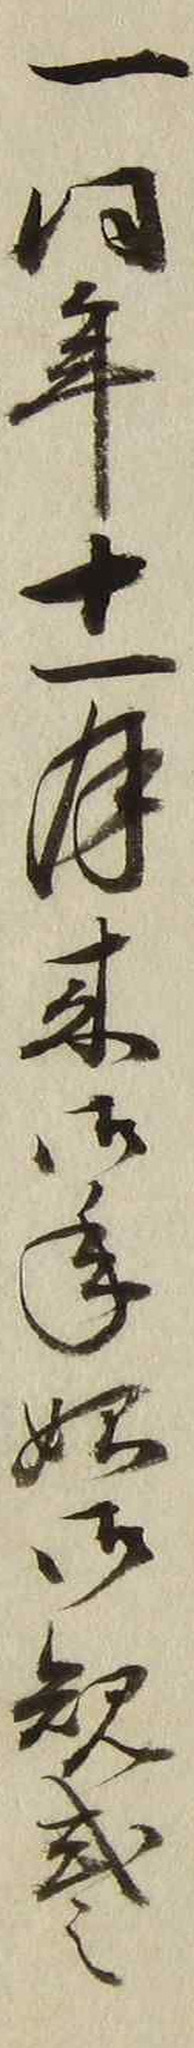一同年十一月来御年始御規式之
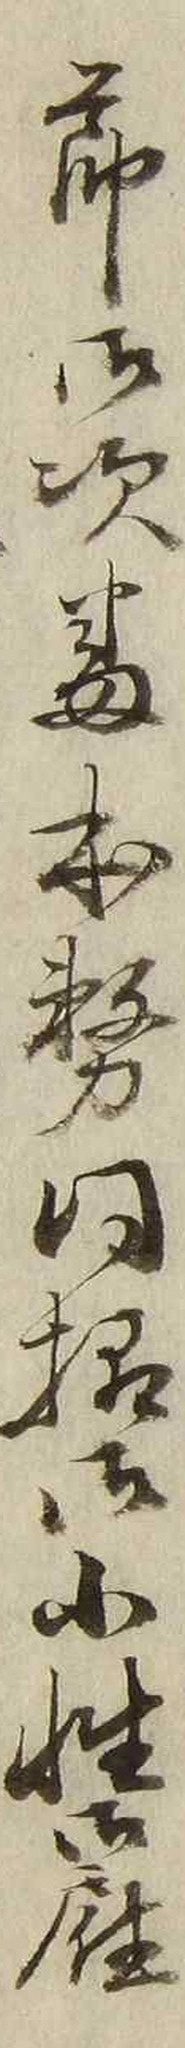節御次番本務同様御小性御雇
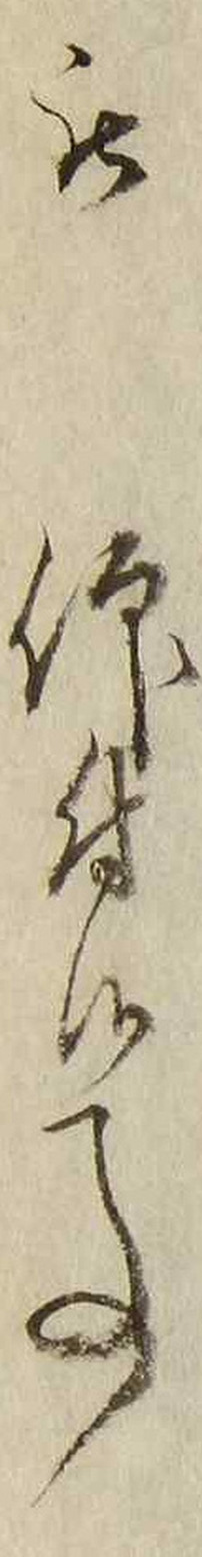被仰付候事
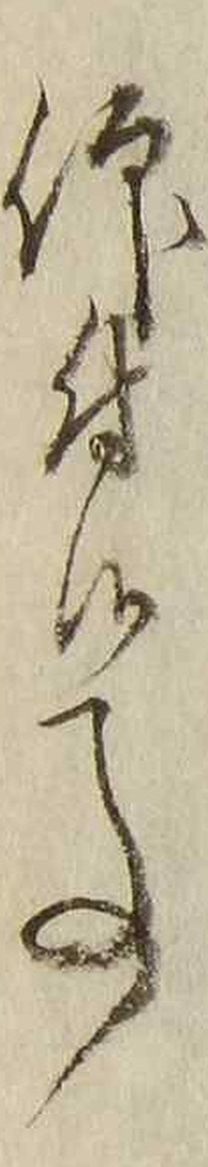仰付候事

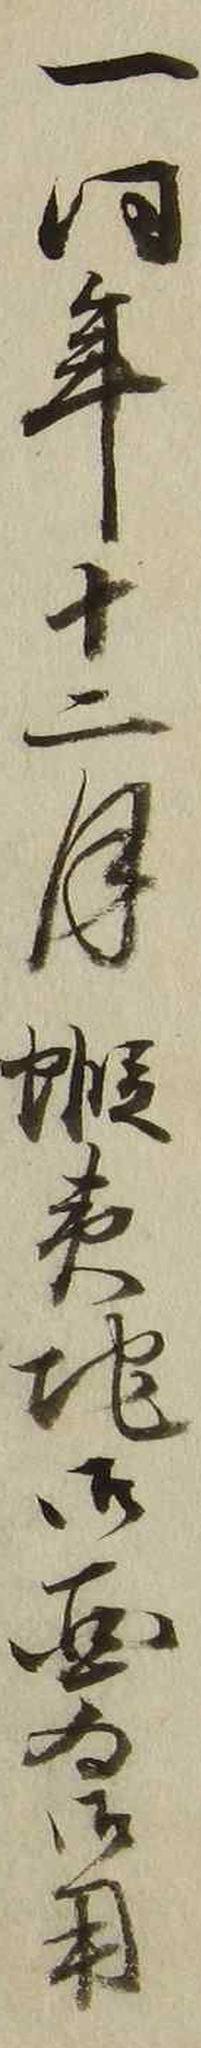一同年十二月蝦夷地御固為御用
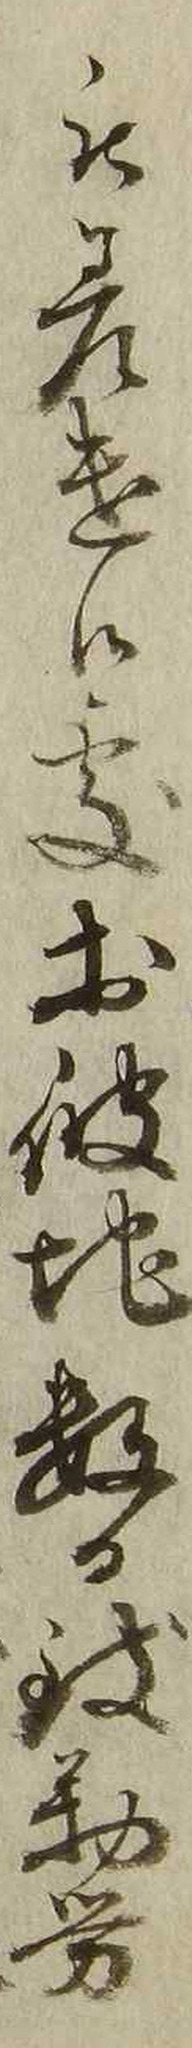被差遣候処於彼地数日致勤労
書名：諸士系譜　巻之36　は之部4
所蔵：会津若松市立会津図書館
